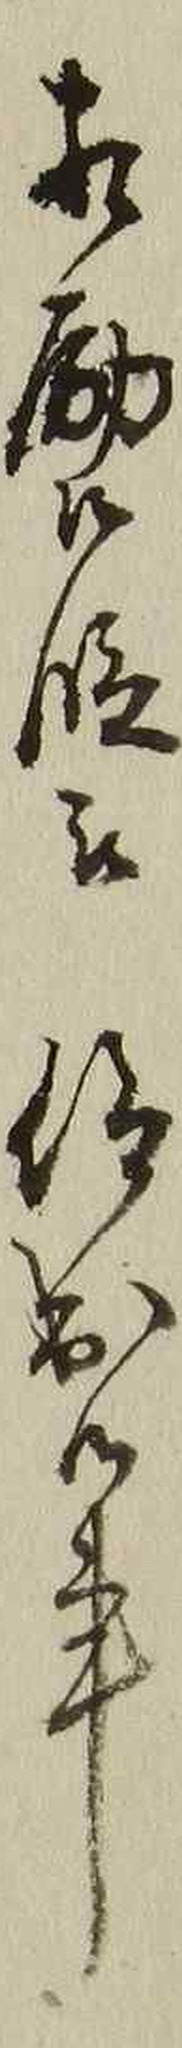相励候段被仰出候事
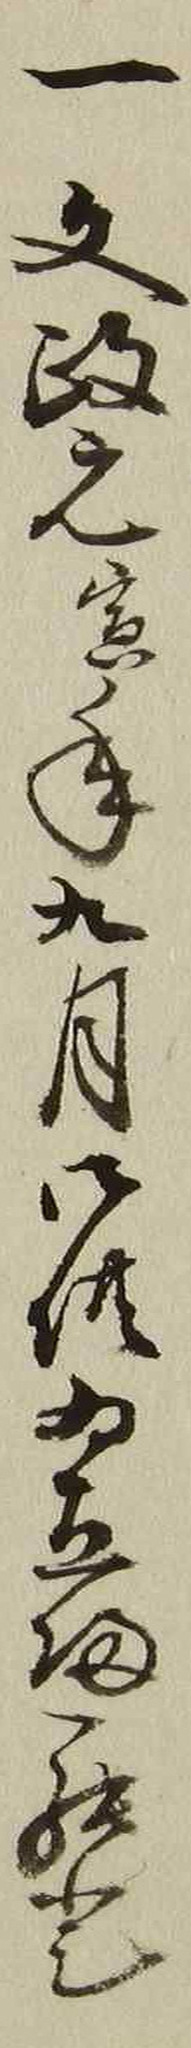一文政元寅年九月御供為立帰罷登
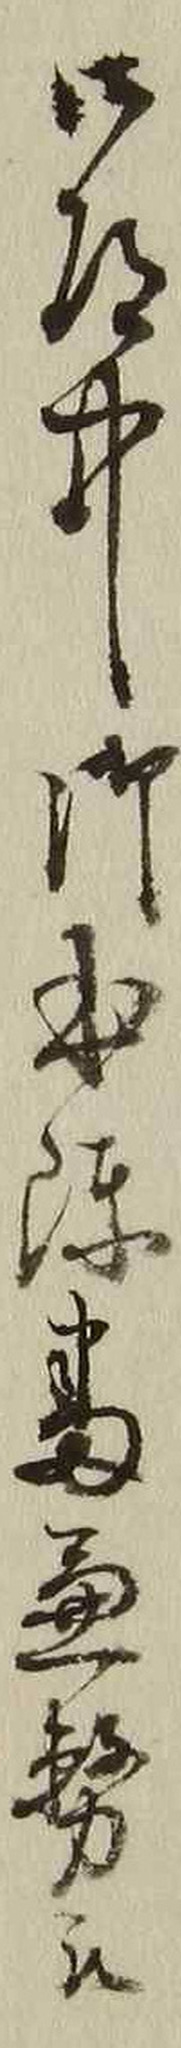御道中御本陳番兼務被
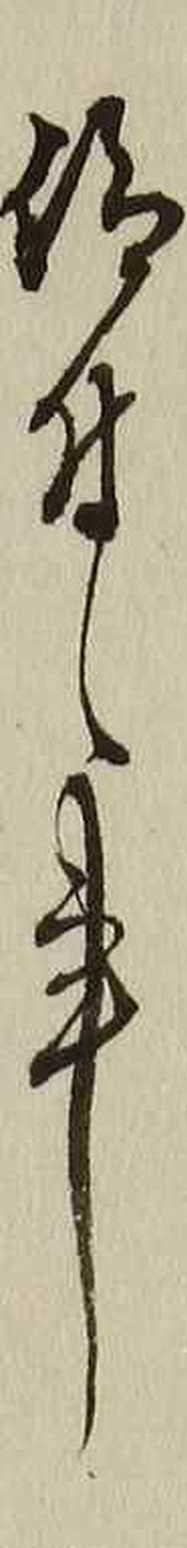仰付候事
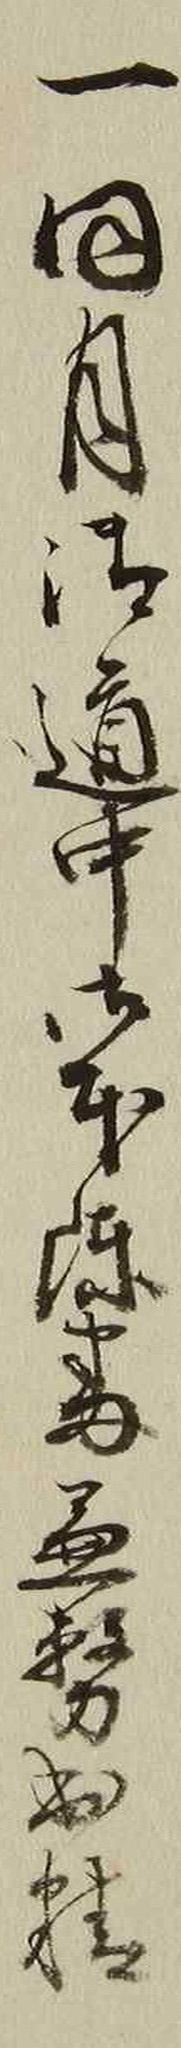一同月御道中御本陳番兼務出精
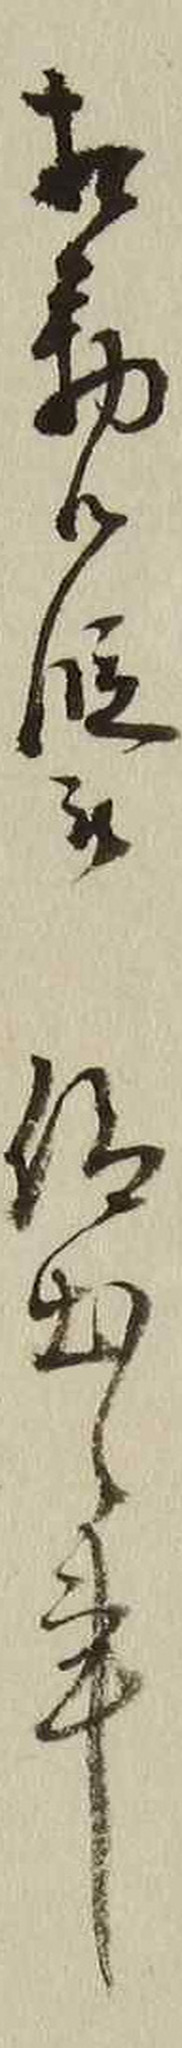出相勤候段被仰出候事
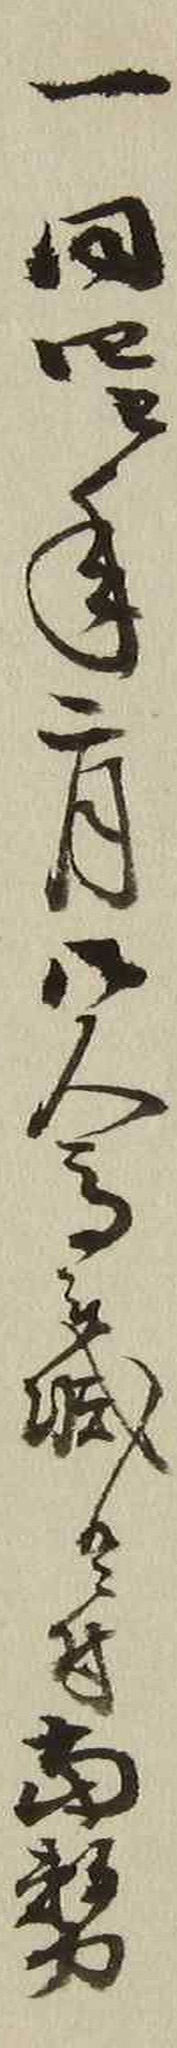一同四巳年二月御人馬被減候ニ付当務
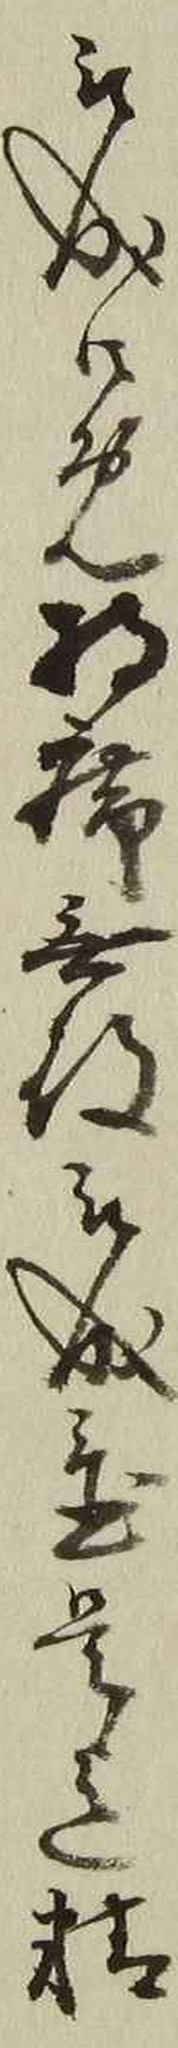被成御免持席無役被成置是迄精
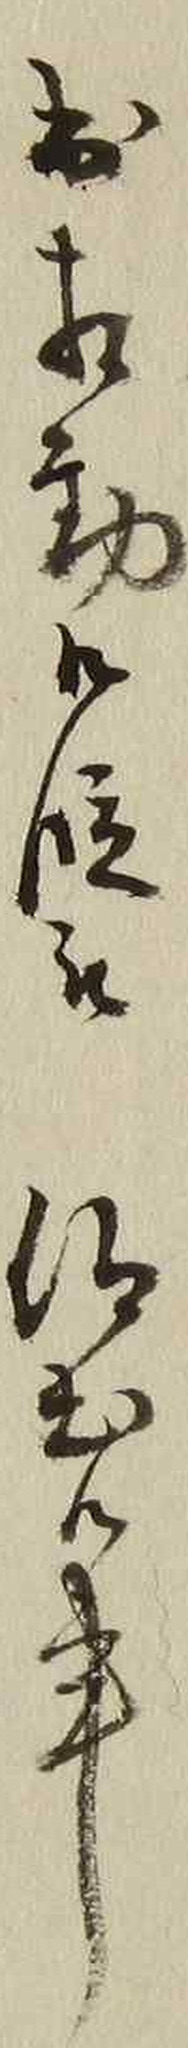出相勤候段被仰出候事
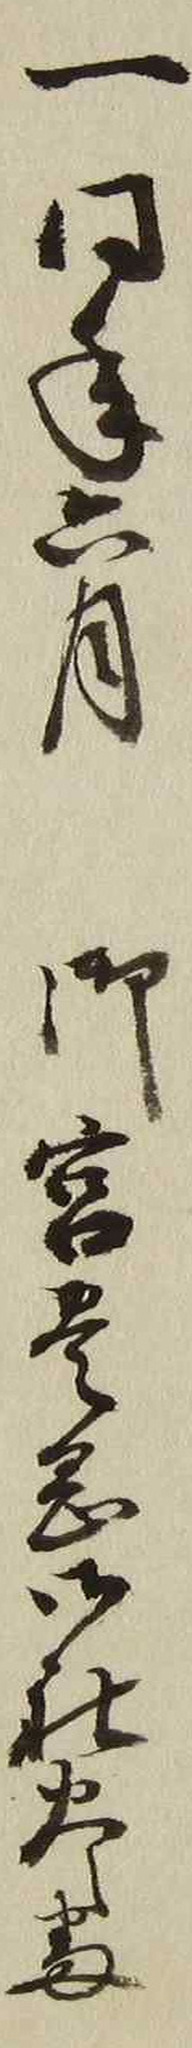一同年六月御宮豊岡御社火之番
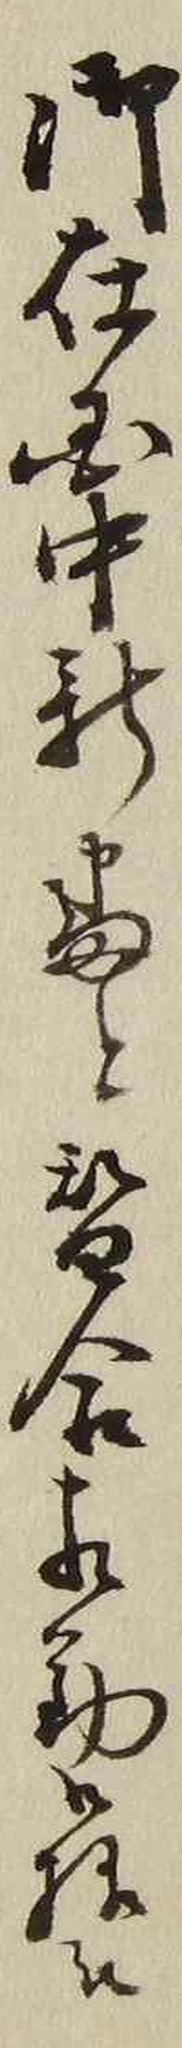御在国中新番と替合相勤候様被
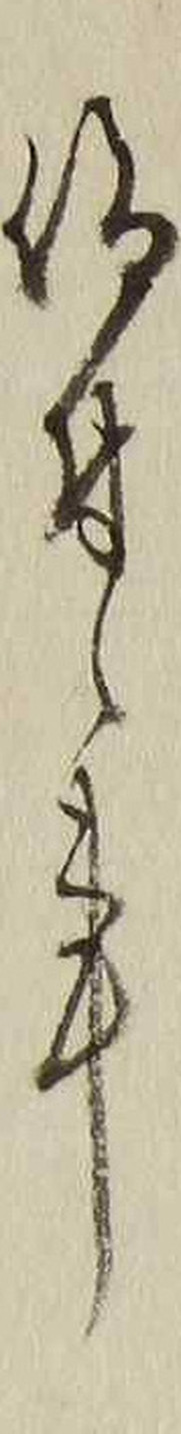仰付候事
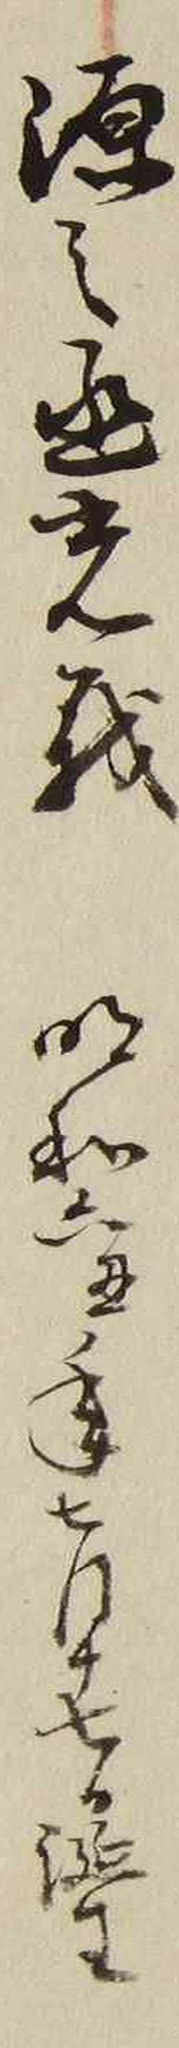源之丞光義明和六丑年七月十七日誕生

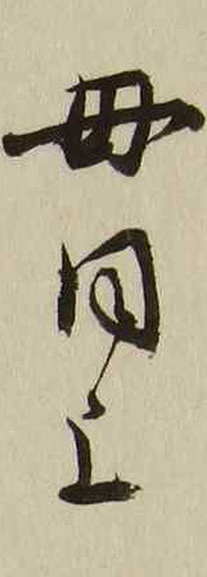母同上
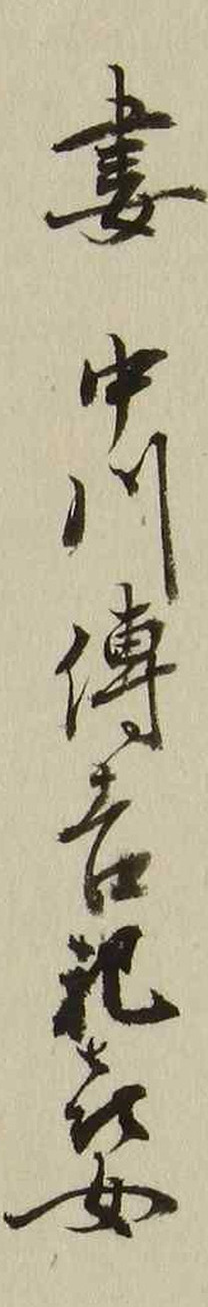妻中川伝吉礼喜女
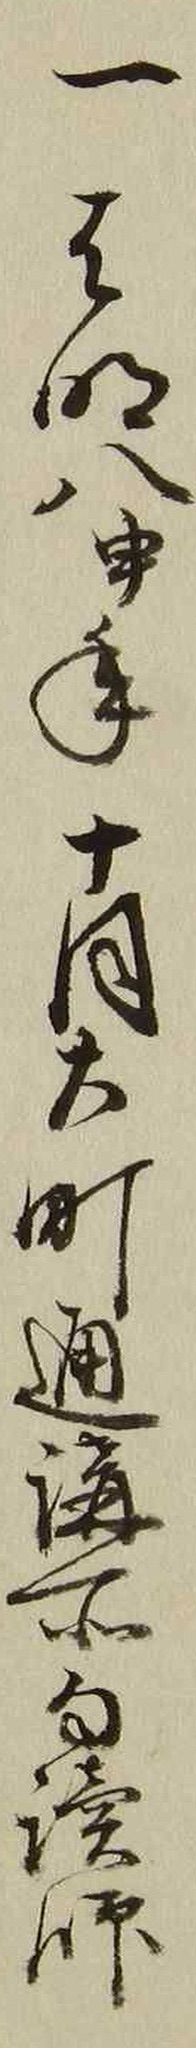一天明八申年十月大町通講所句読師
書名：諸士系譜　巻之36　は之部4
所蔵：会津若松市立会津図書館
